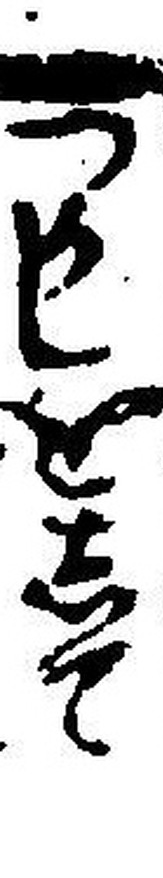つかしをして
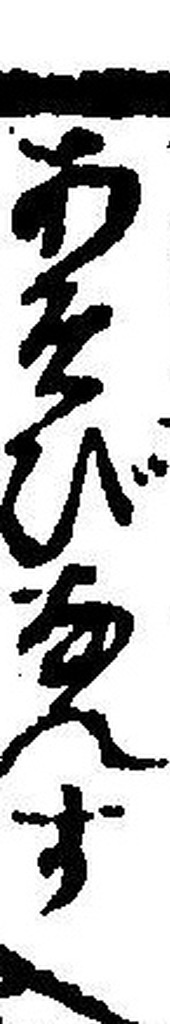あそびなんす
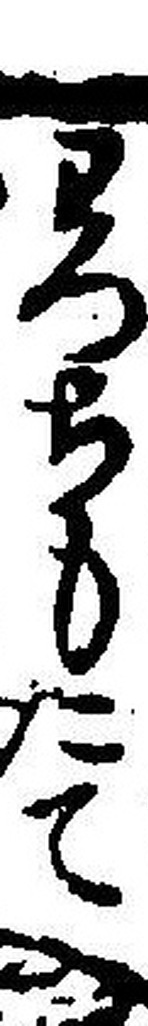わつちもたて
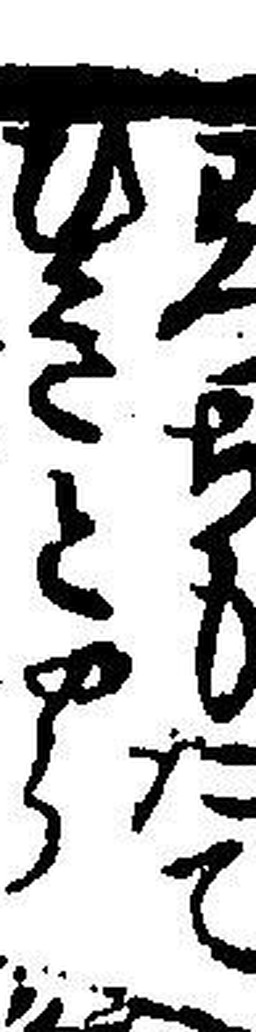ひきとやら
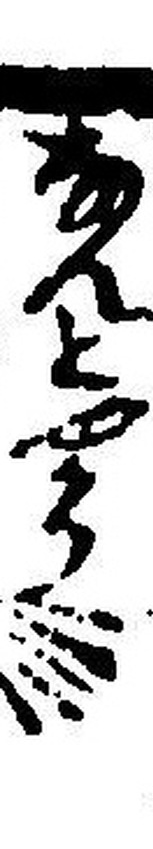なんとやら
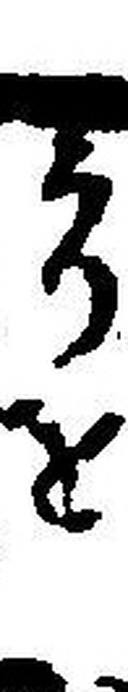うりを
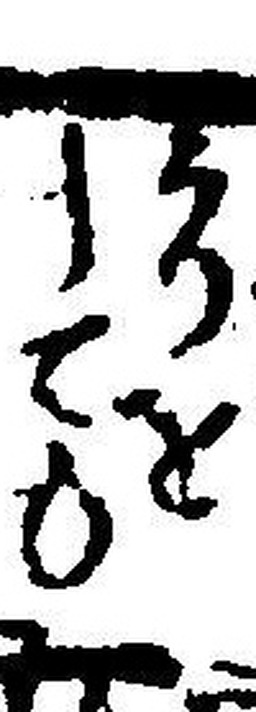しても
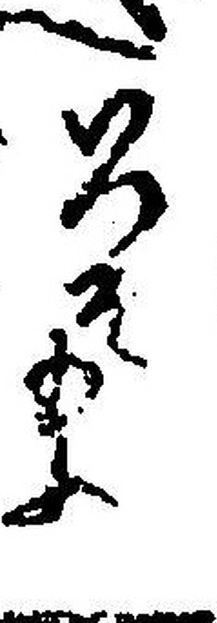いつそもふ
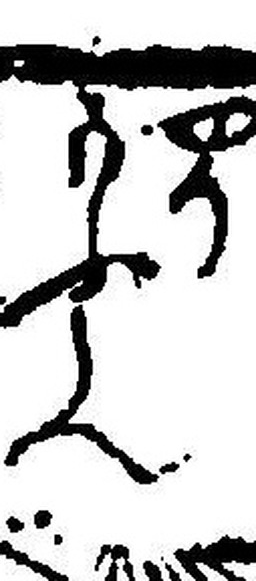もふしん
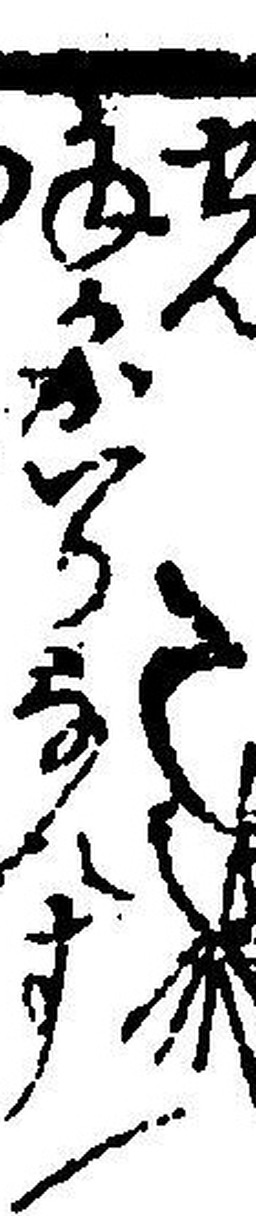かねかおいりなんす
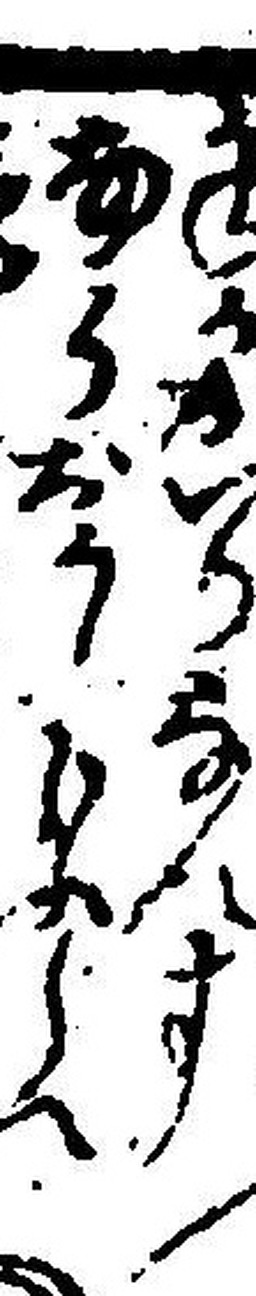ならおかしもふしん
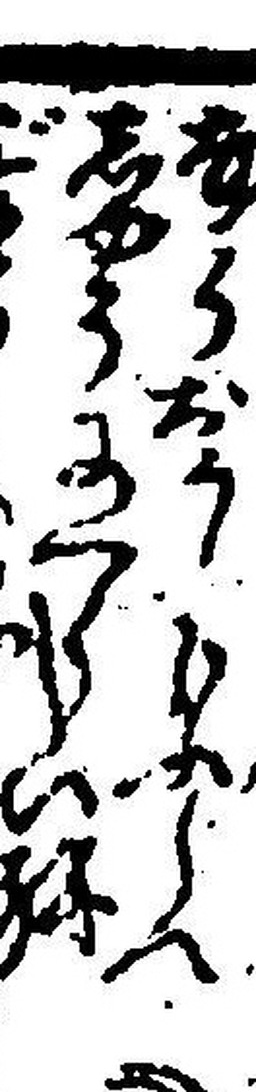しやうにくらしいね
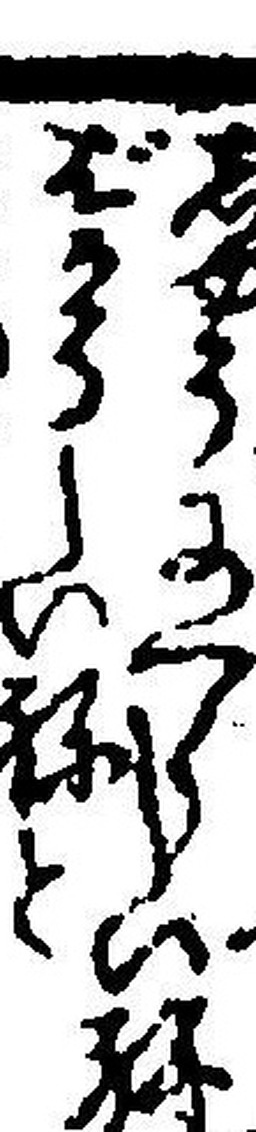ばからしいねと
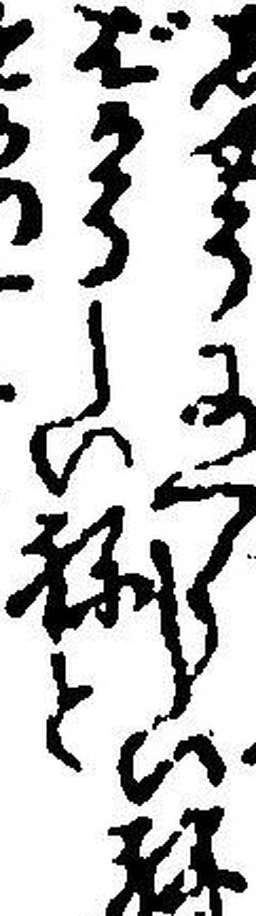ばからしいねと
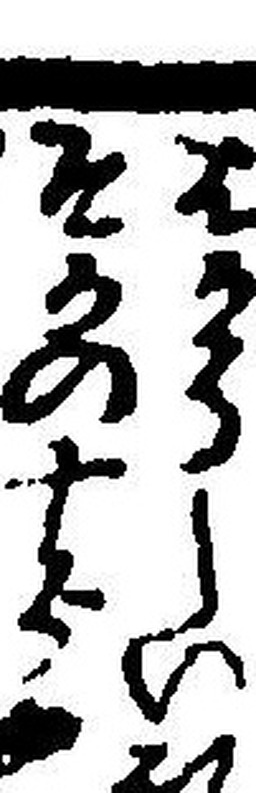そかの十郎
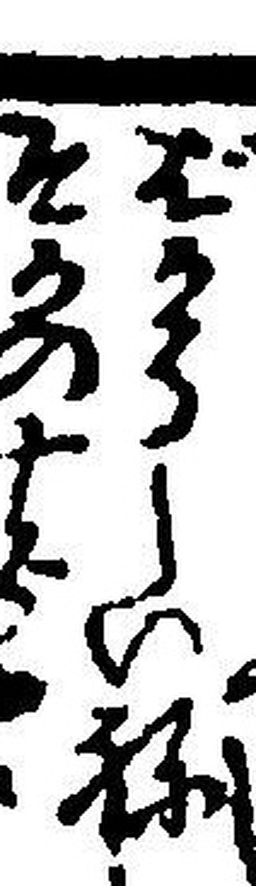そかの十郎
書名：間違狐之女郎買 / 市場通笑作
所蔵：東京大学総合図書館 General Library in the University of Tokyo, JAPAN
